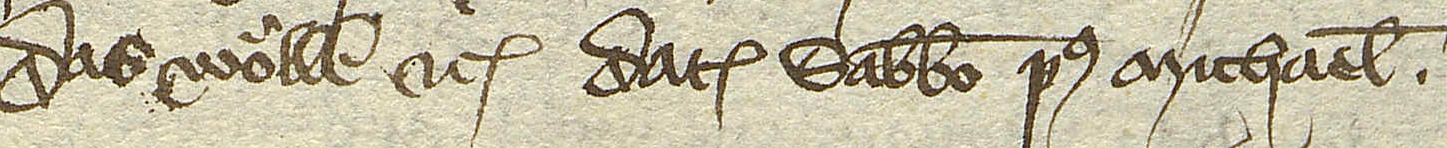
Das wölle* ec* Dat* Sabbo* p* Michael* .
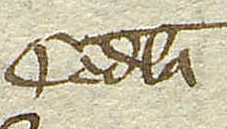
Cedla*
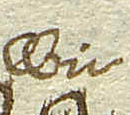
wir
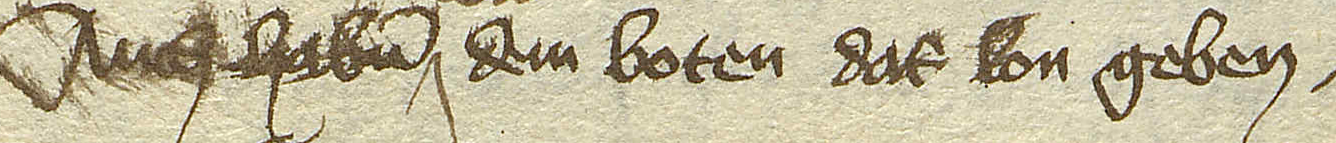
Auch habn* dem boten das lon geben /
